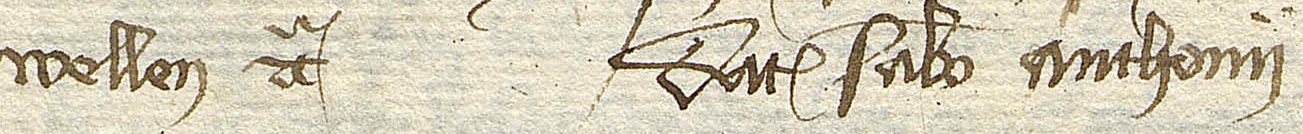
wellen ec* Dat* ſabo* anthonii
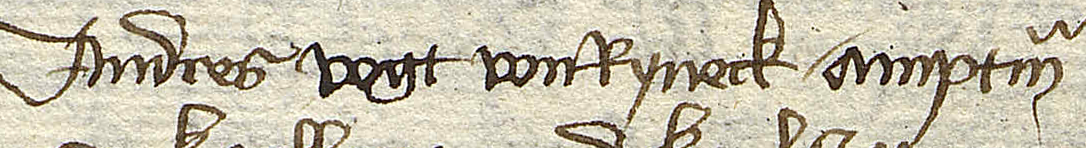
Andres vogt von Ryneck / amptm*
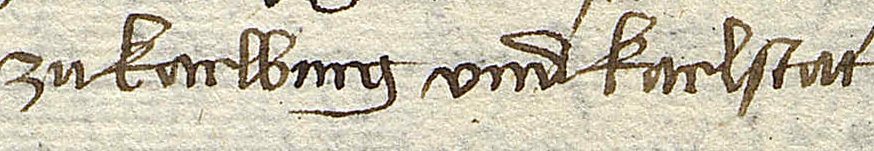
ʒu karlburg vnd karlſtat
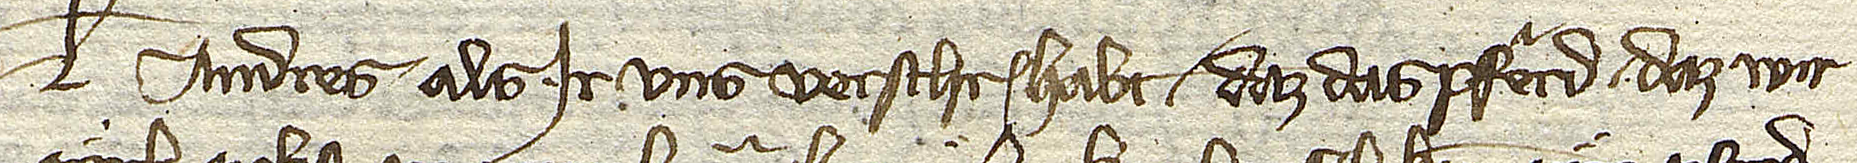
L* Andres als Ir vns verſchr* habt / daʒ das pfërd / daʒ wir
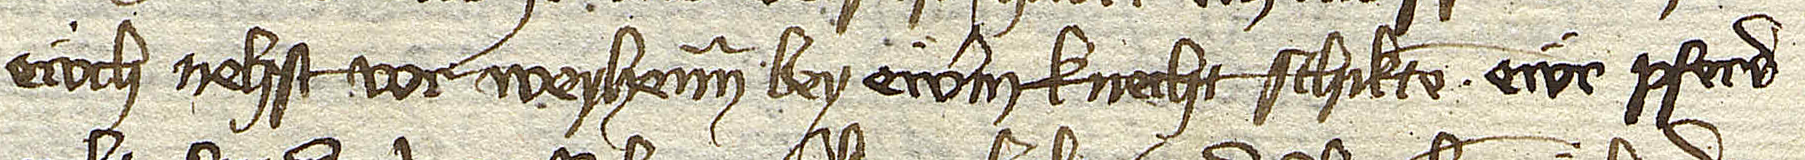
ewch nehſt vor weyheim* bey ew*m knecht ſchikte* . ewr pferd
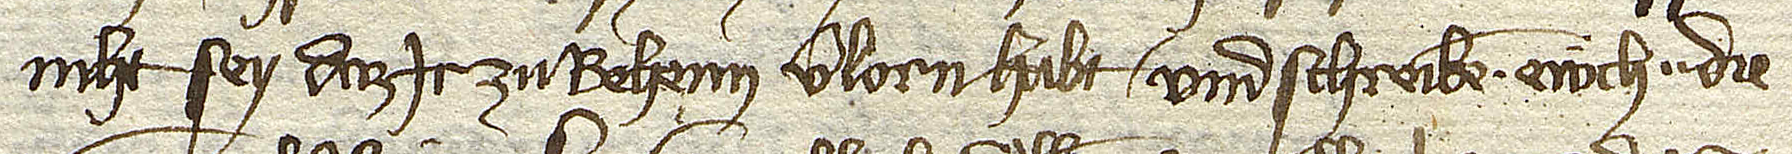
niht ſey daʒ Ir ʒu Beheim v*lorn habt / vnd ſchreibe* . ewch ~ die
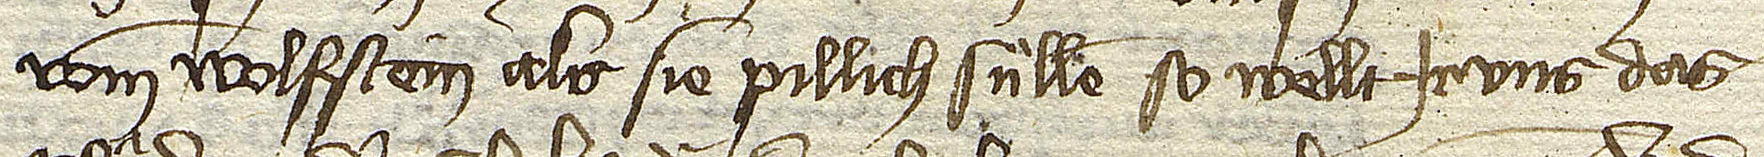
vom* wolfſtein als ſie pillich ſülle* ſo wellt Ir vns das
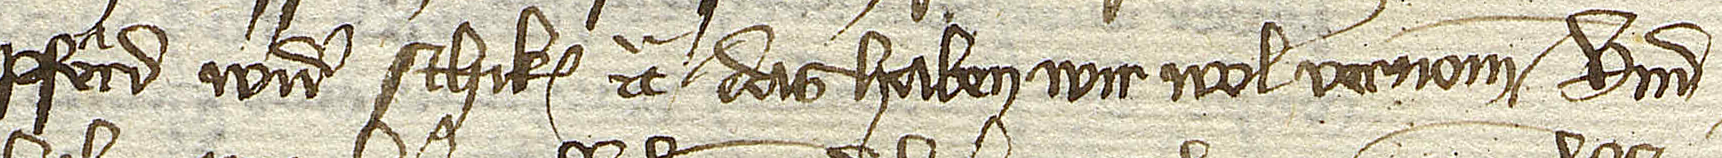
pfërd wid* ſchik* ec* / das haben wir wol vernom* / Vnd
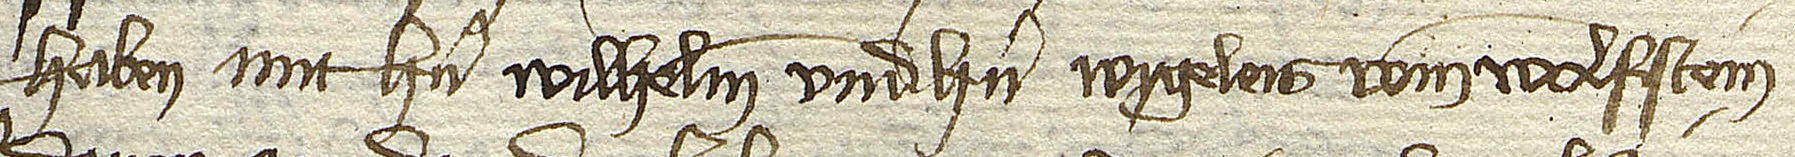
haben mit h*n wilhelm* vnd h*n wygeleis vom* wolfſtein
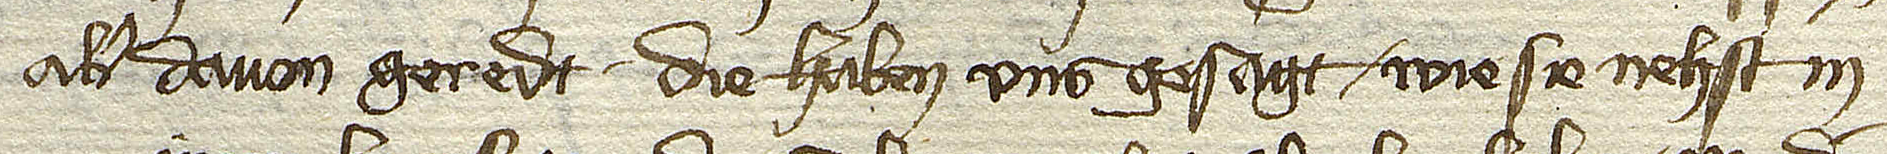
ab* dauon geredt / die haben vns geſagt / wie ſie nehſt in
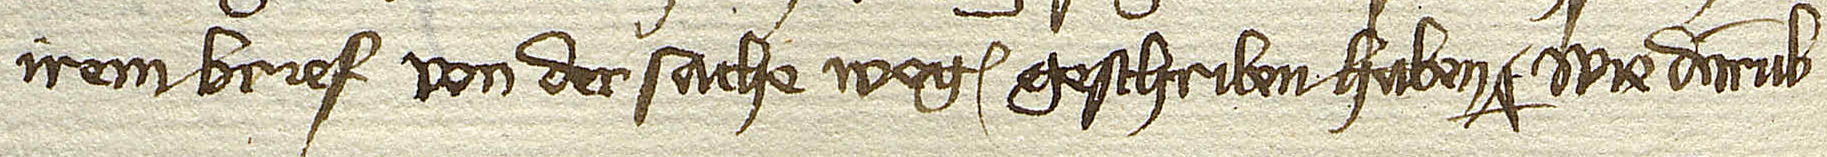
irem brief von der ſache weg* geſchriben haben wie daru*b
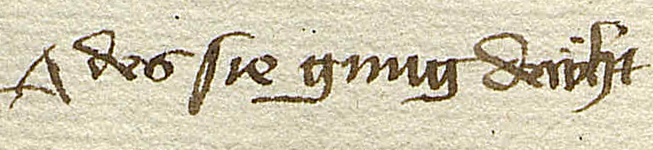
des ſie gnug dewht
